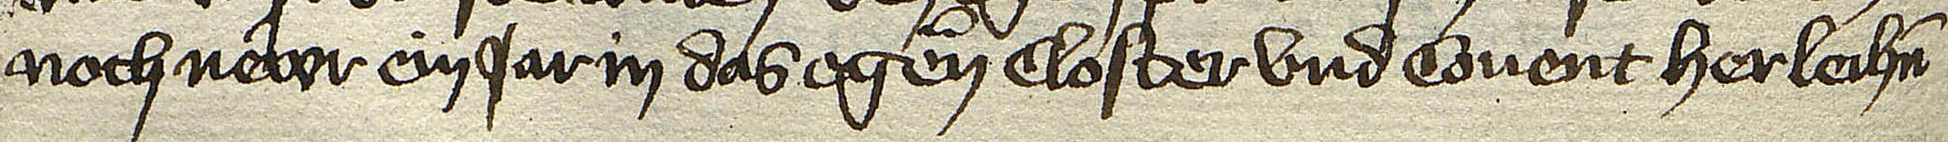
noch newr ein Iar in das egen* Cloſter vnd Couent her leih*n
